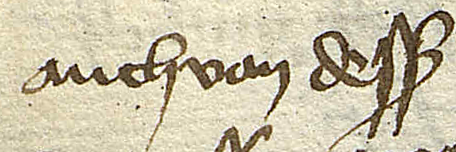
auch von deſſ*
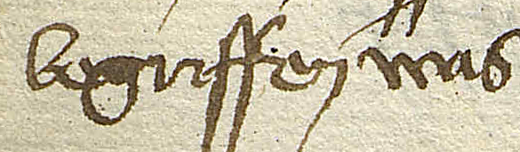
begriffen was
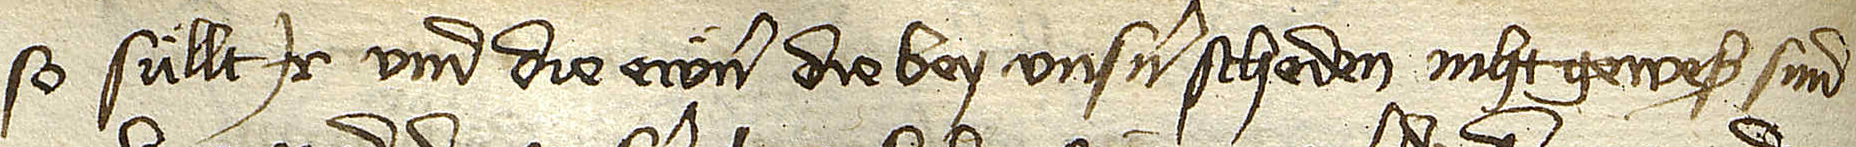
ſo ſüllt Ir vnd die ew*n die bey vnſ*n ſcheden niht geweſ* ſind
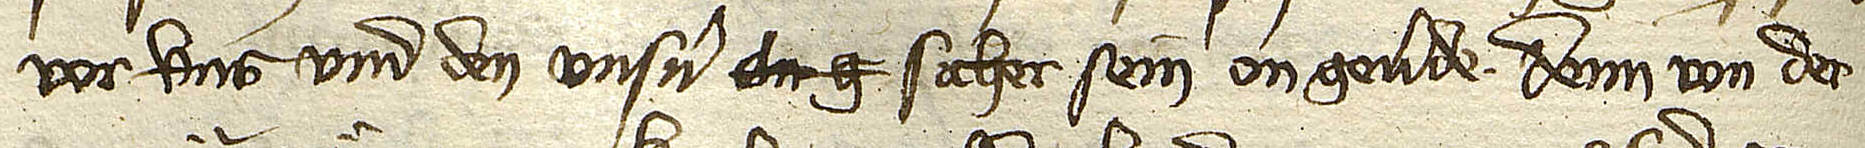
vor Vns vnd den vnſ*n on g ſicher ſein on geu*de . Denn von der
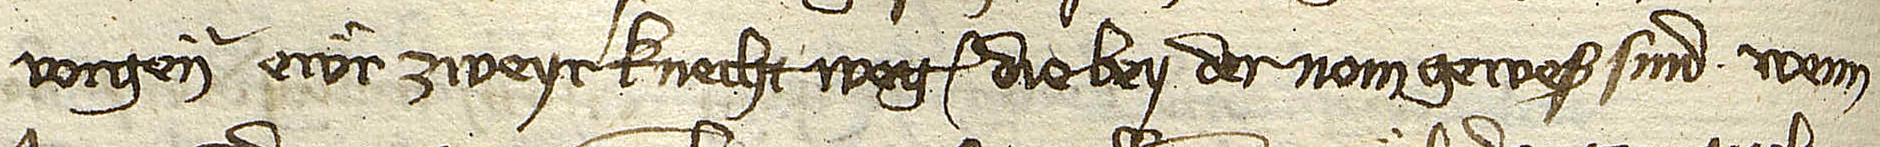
vorgen* ewr ʒweyr knecht weg* die bey der nom geweſ* ſind . wenn
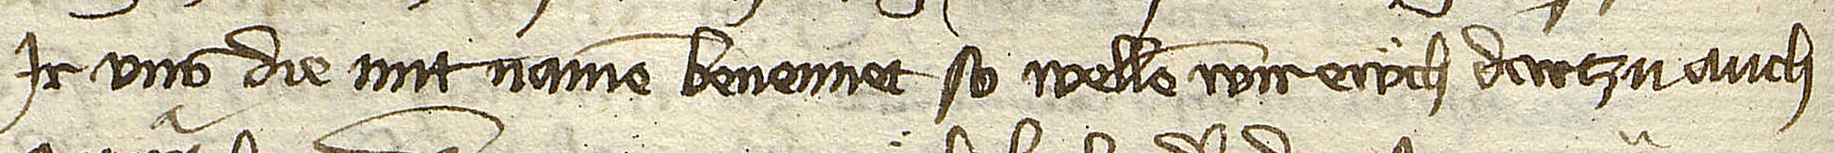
Ir vns die mit name* benennet ſo welle* wir ewch darcʒu auch
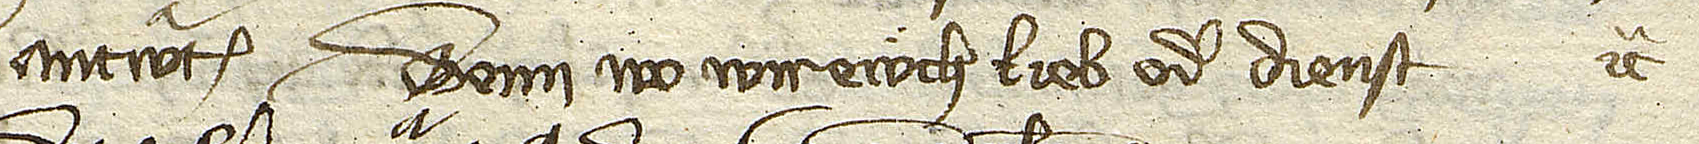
antw*t / Denn wo wir ewch lieb od* dienſt ec*
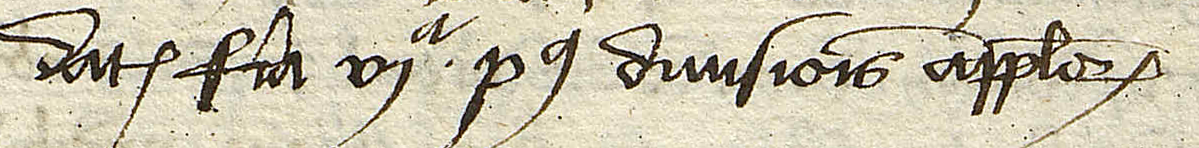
Dat* fia* vi* p* diuiſio*is applo*
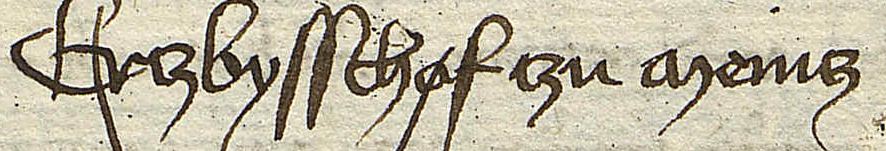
Ercʒbyſſchof cʒu Meincʒ
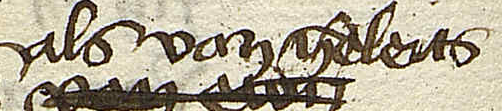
als von geleits
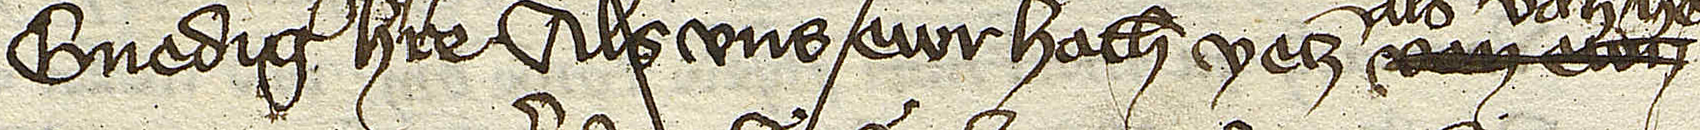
Gnedig* h*re . Als vns ewr hoch* yecʒ* von ewn*
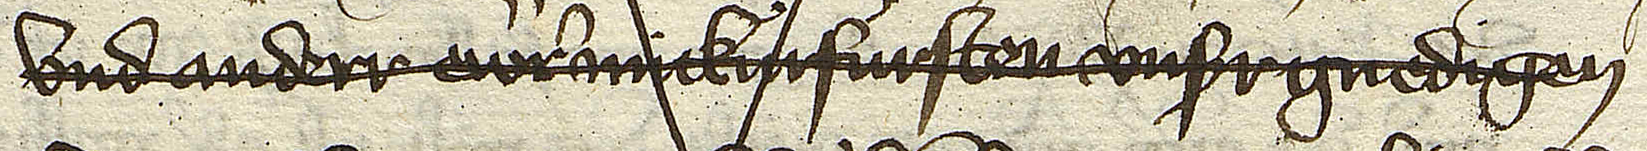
vnd anderr ew*r mitkürfürſten vnſ*r gnedigen
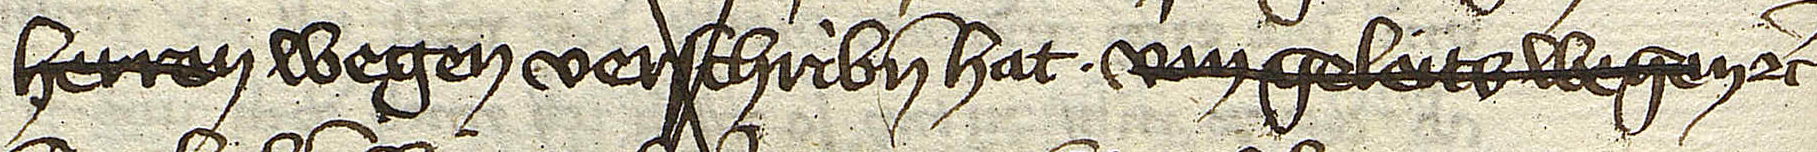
herren wegen verſchrib*n hat . von geleits wegen ec*
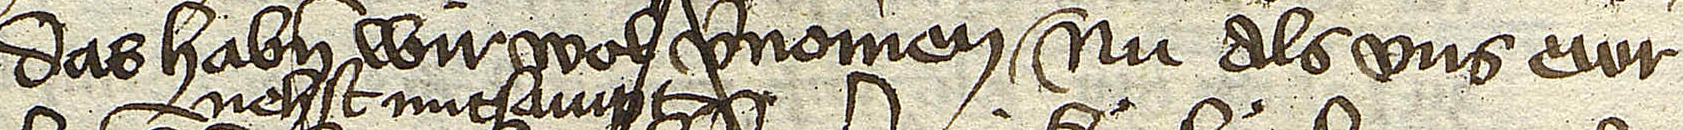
das hab*n wir wol v*nomen / Nu Als vns ewr
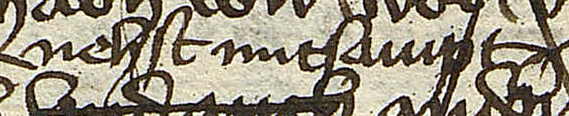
nehſt mitſampt
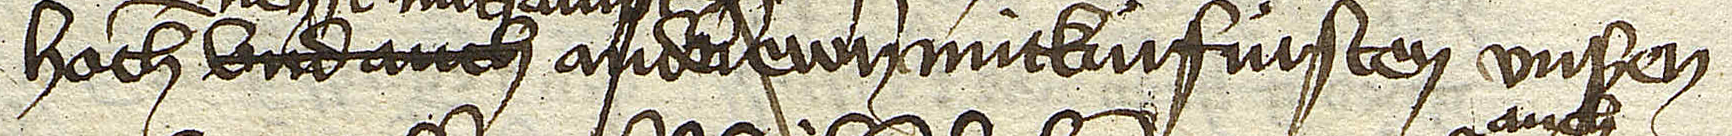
hoch* vnd auch ander* ew*n mitkürfürſten vnſ*en
